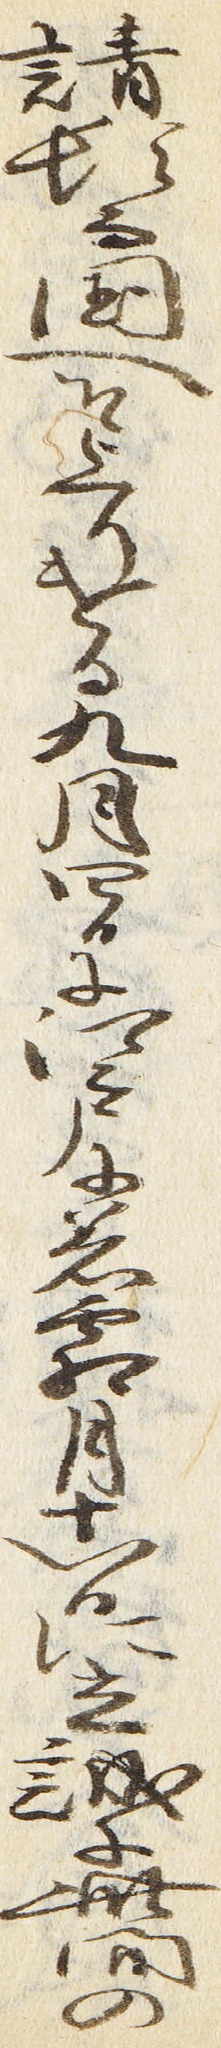請頓而国へそ上りける九月四日に江戸に着霜月十八日に立誠に此間の
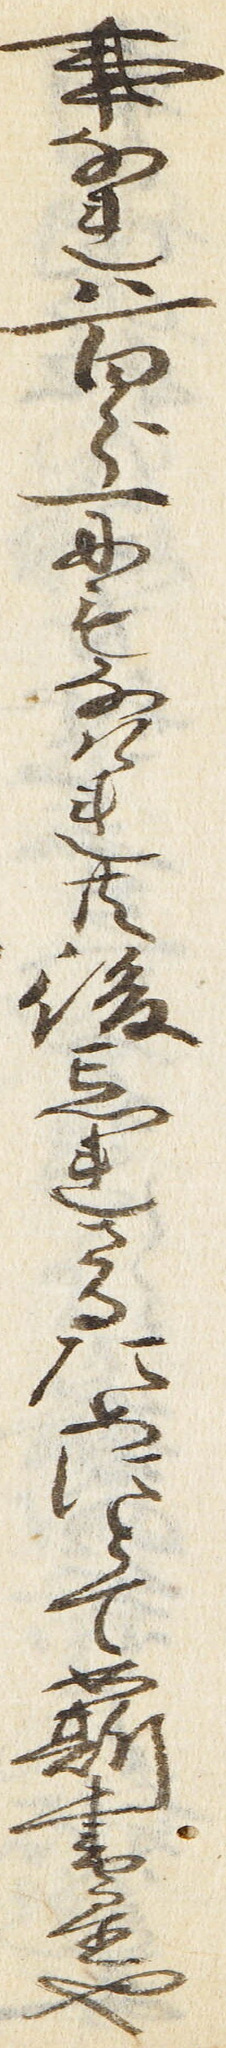事なれは百分一にもなけれ共後忘れさるためにとて如斯書置也
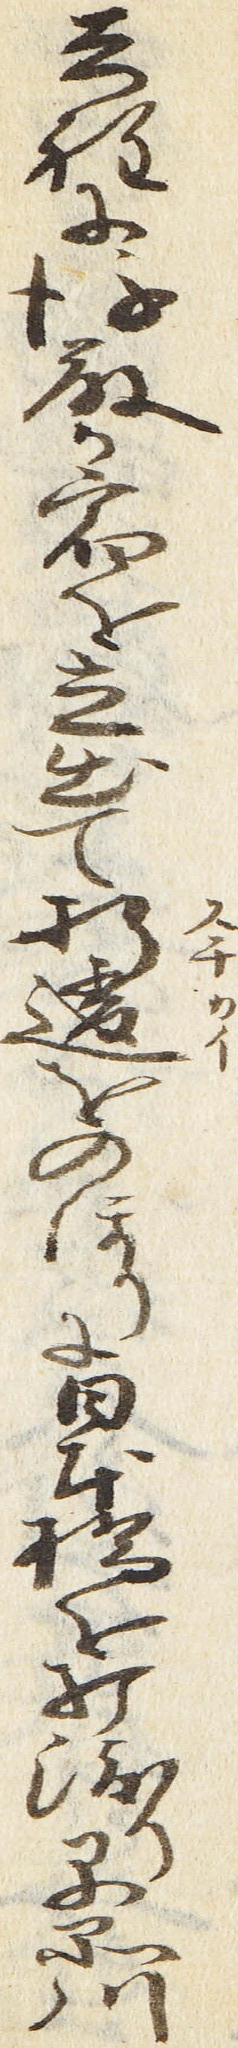去程に後藤か宿を立出て行違をのほりに日本橋を打渡り早品川
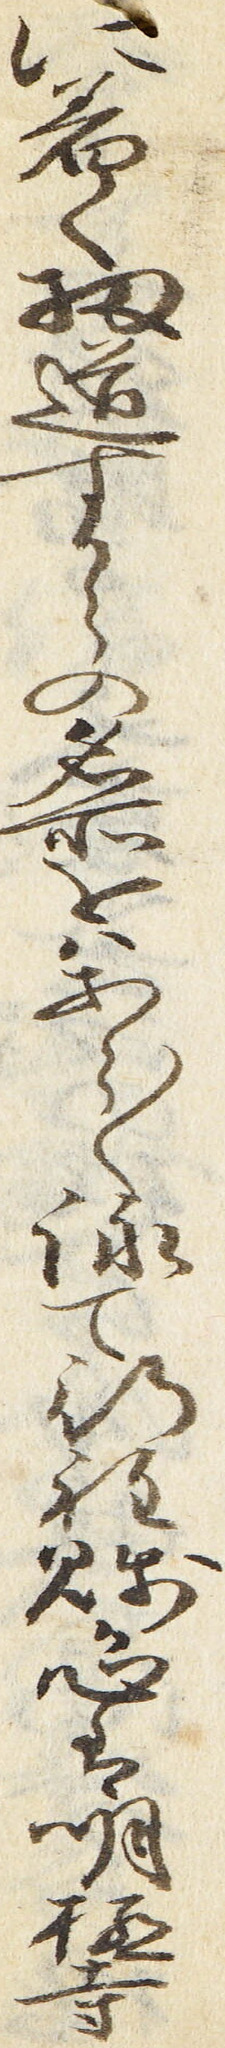に着く扨道すからの名所をはあら〳〵詠て行程賎か心は明極寺
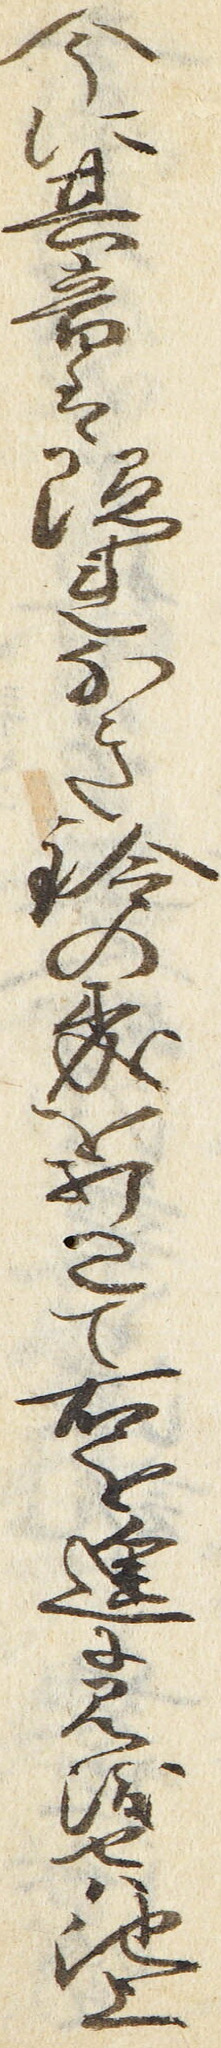今に其音は隠れなき鈴の森を打過て右を遥に見渡せは池上

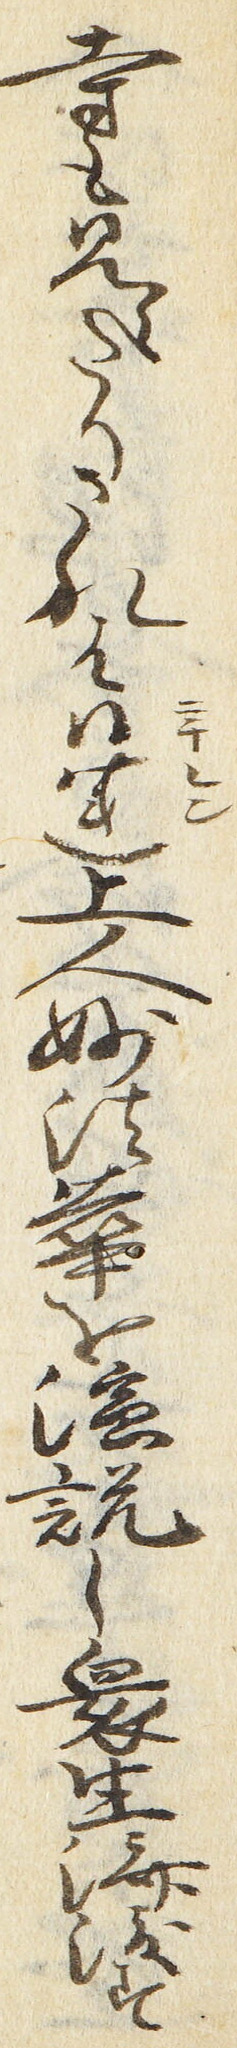寺も見えたりされは日蓮上人妙法華を演説し衆生済渡す
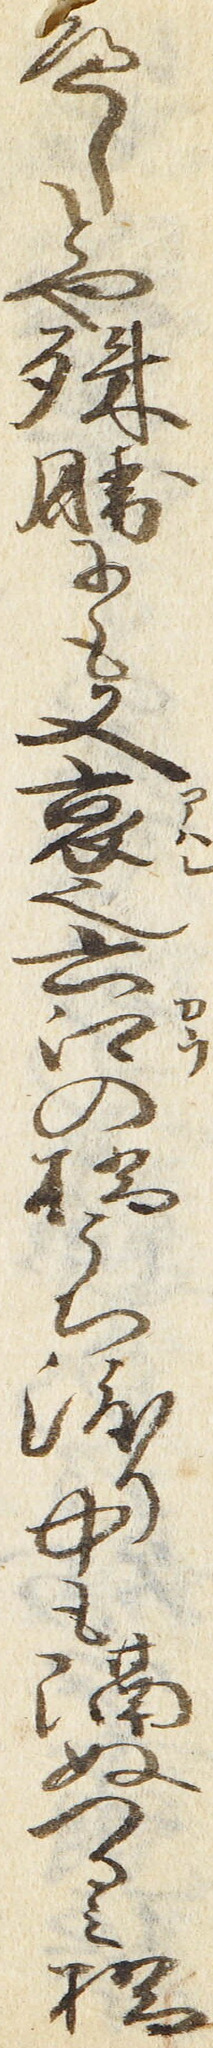へしとや殊勝にも又哀也六郷の橋うち渡り中も隔ぬつるみ橋
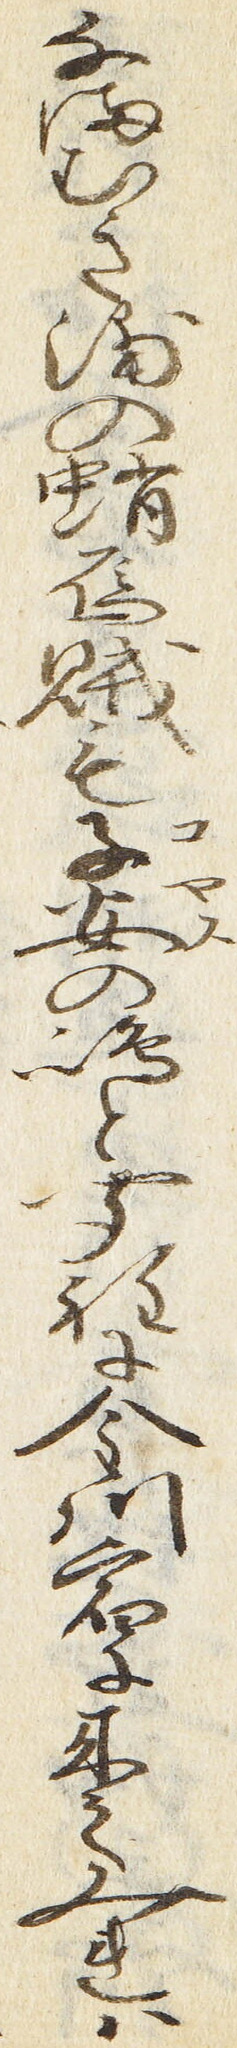なまむき浦の鮹烏賊も子安の嶋と聞程に金川宿に来てみれは
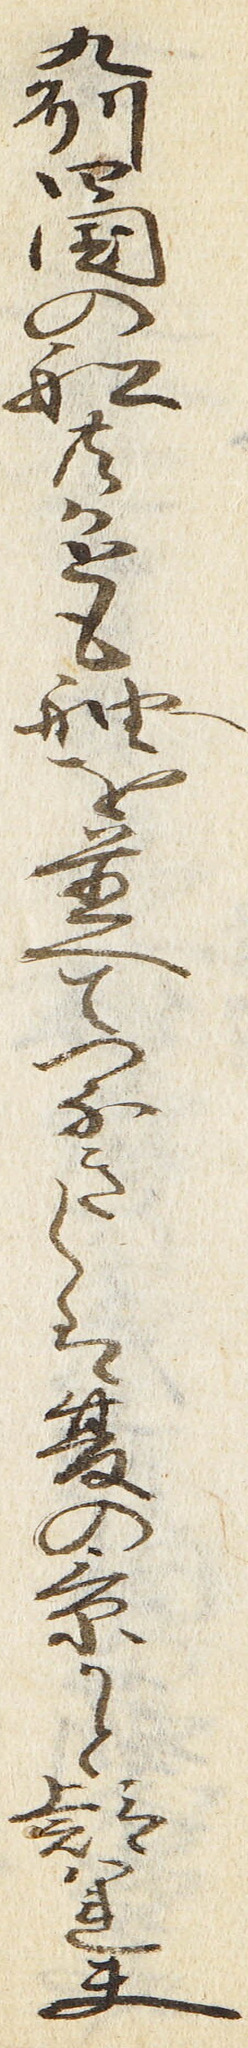九州四国の船共かとも舳を並へてつなきしは夏の景かと疑はれ夫
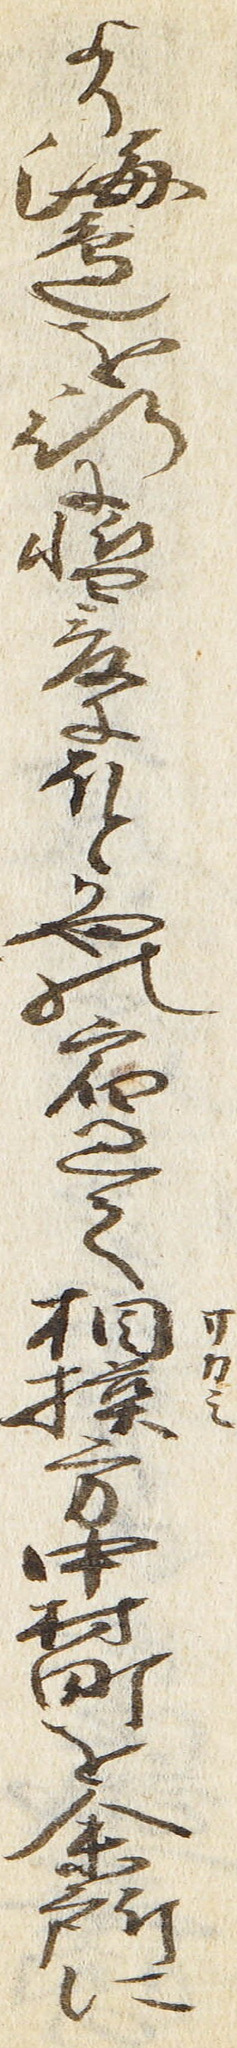より海辺を行に暫爰にそとかやの宿過て相模方中村町を余所に
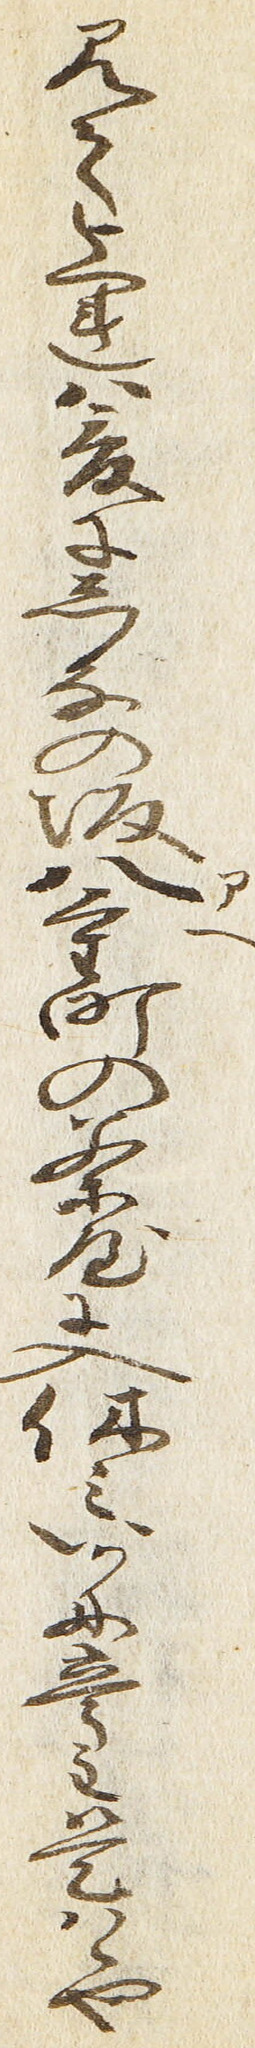見て上れは爰にしなの坂八重町の茶屋に入休みいかに亭主是はゝや
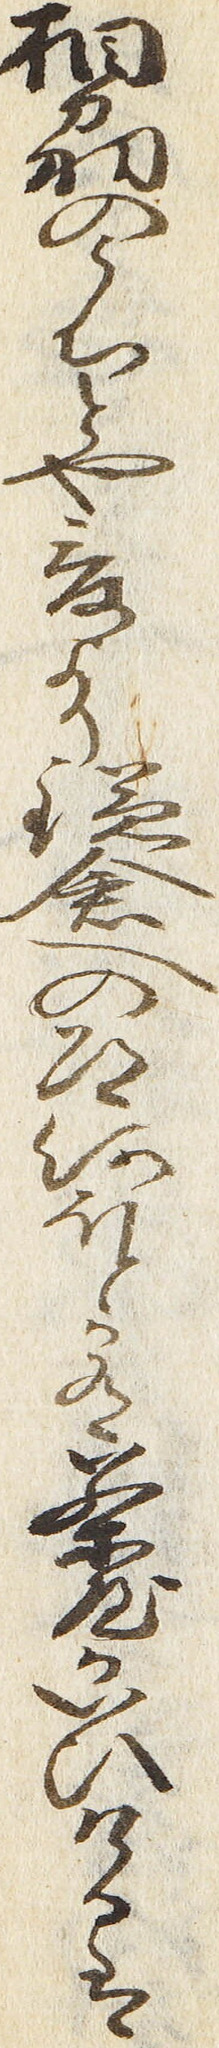相州のうちとや爰より鎌倉への道何ほとか有茶屋かいひけるは
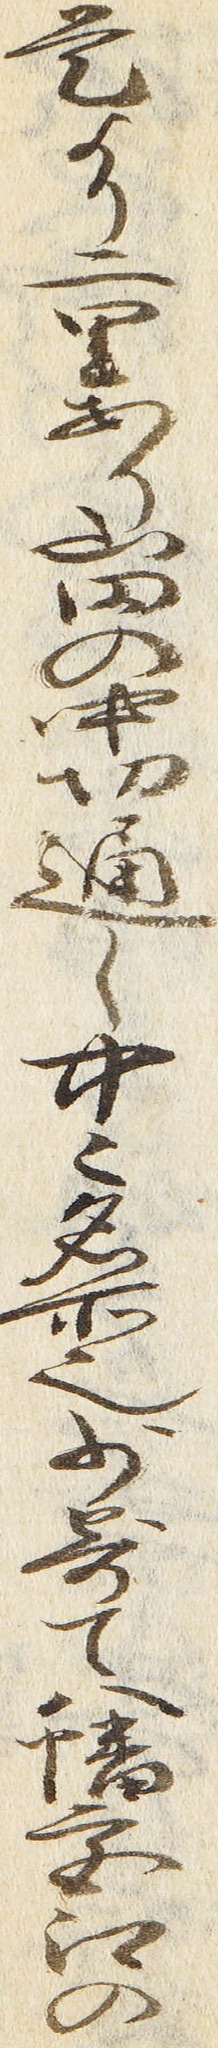是より二里あり山田の中切通し中々名所也少寄て八幡宮江の
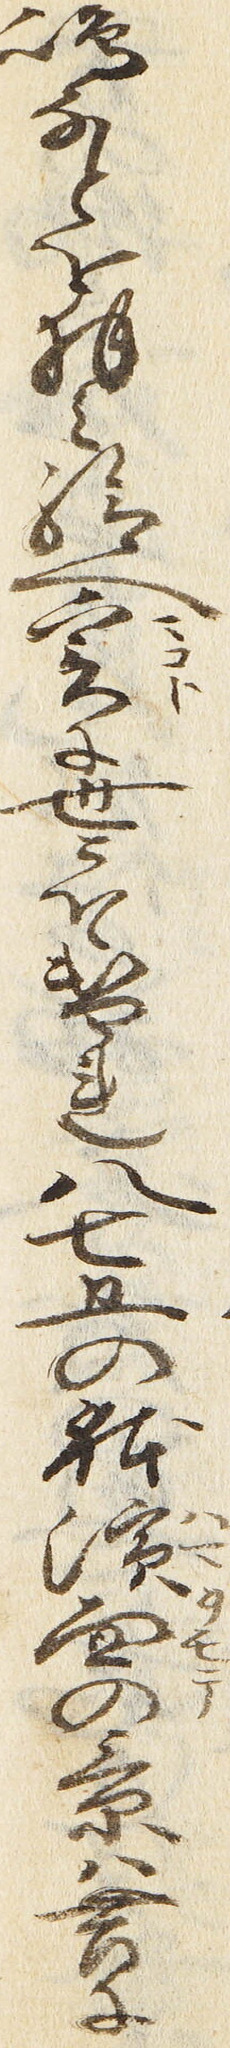嶋なとを拝み給へ実に世こそ替れ八七五の体浜面の景は昔に
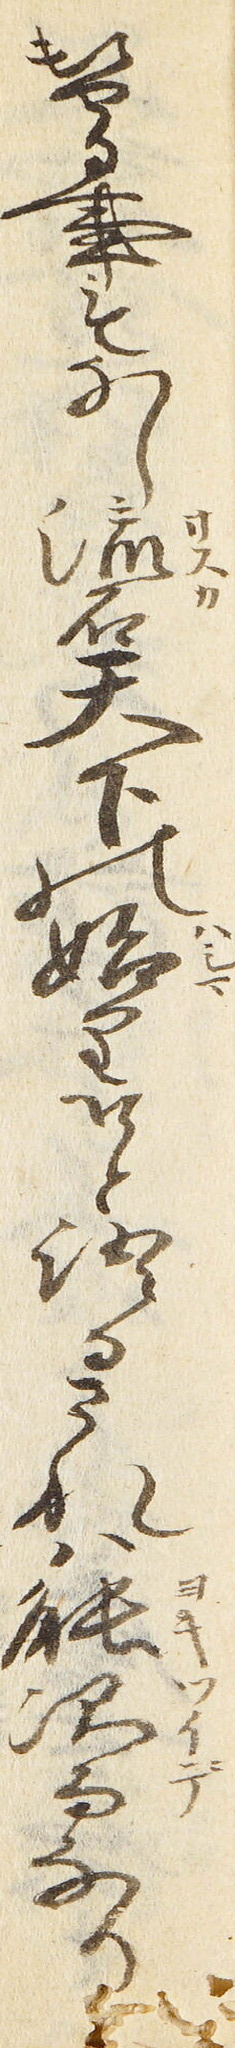替る事もなし流石天下の始りそと語るされは能次而なり
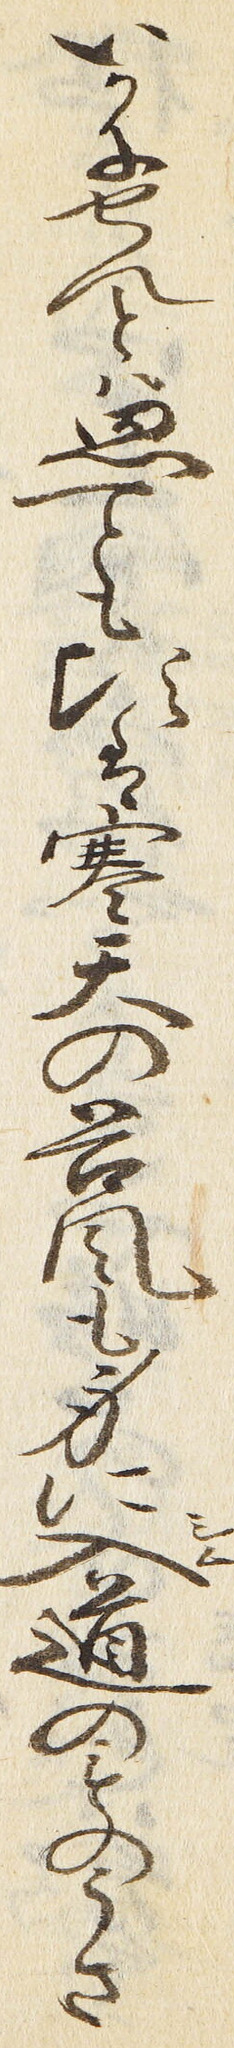いかにせんとは思ても頃は寒天の谷風も身に入道のものうさ
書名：海陸世話日記
